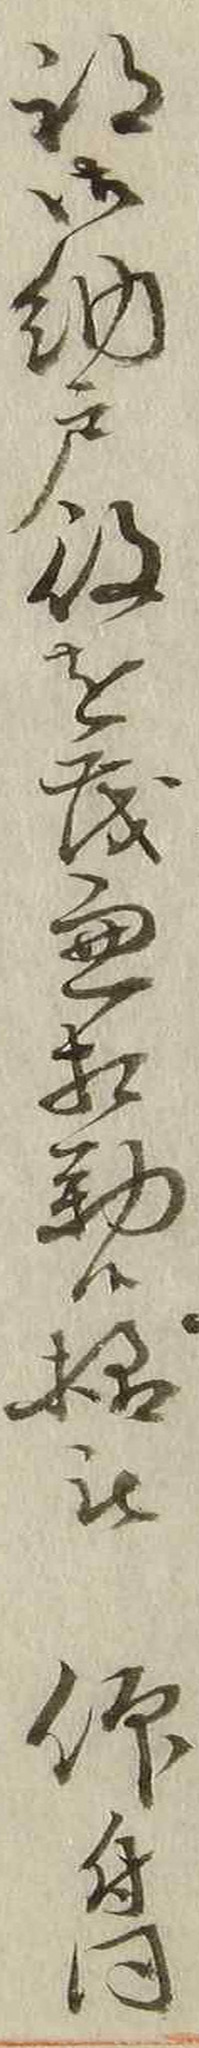跡御納戸役を茂兼相勤候様被仰付同
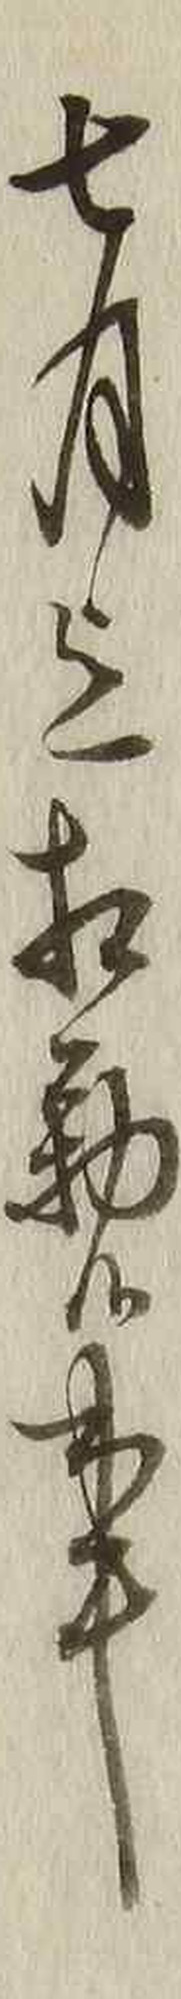七月迄相勤候事
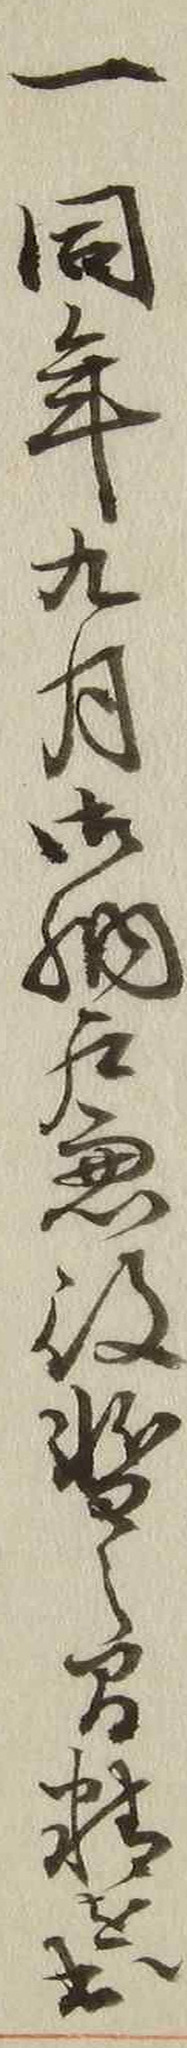一同年九月御納戸兼役暫之間精を出
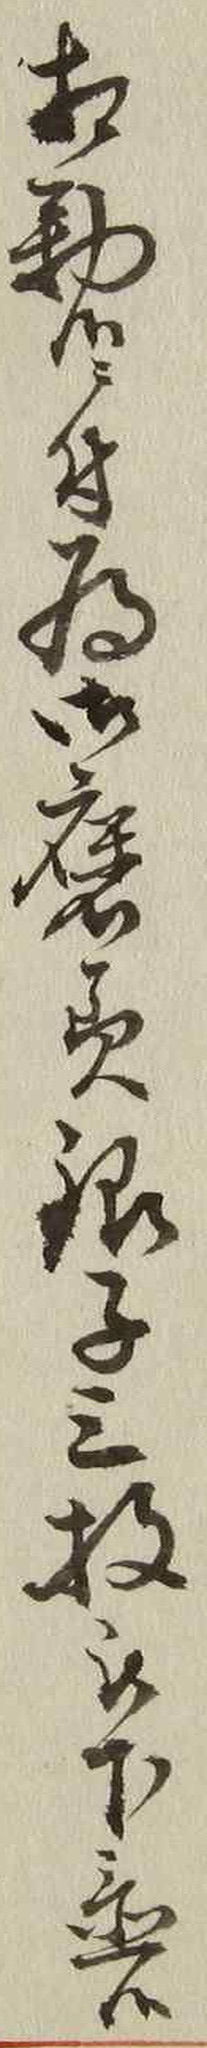相勤候ニ付為御褒美銀子三枚被下置候
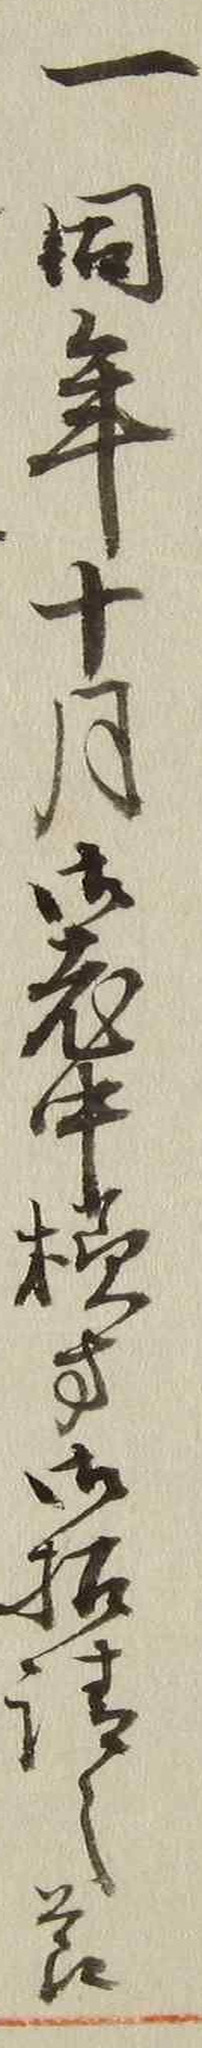一同年十月御老中様方御招請之節
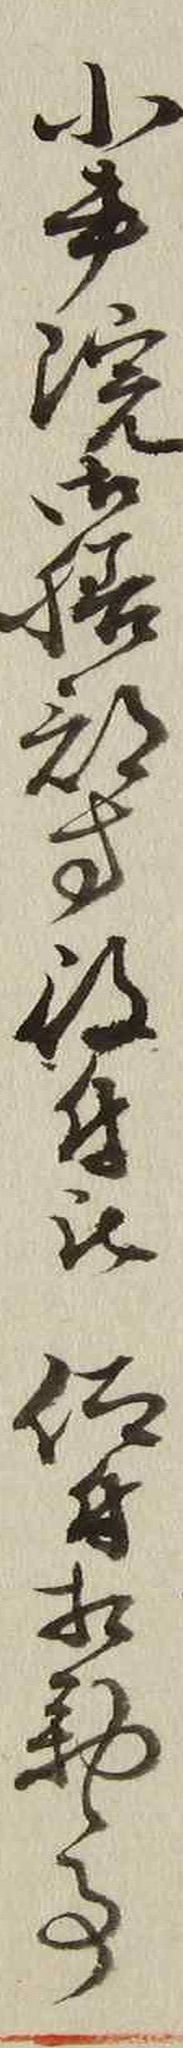小書院御膳部方役付被仰付相勤候事
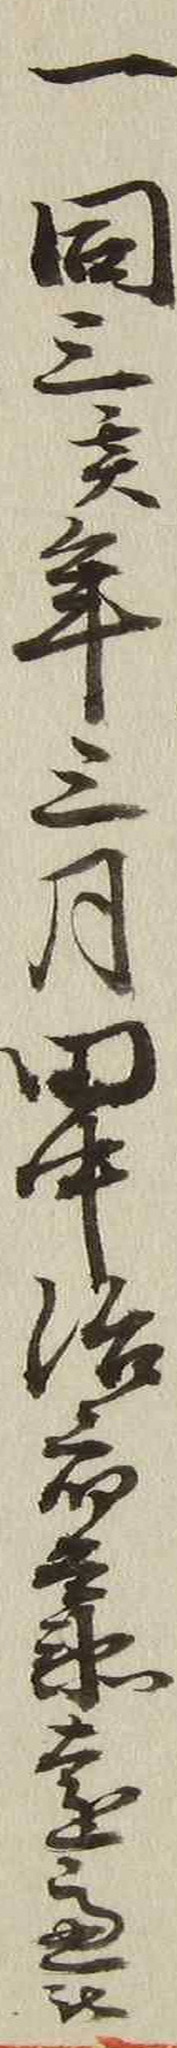一同三亥年三月田中治郎兵衛遠慮被
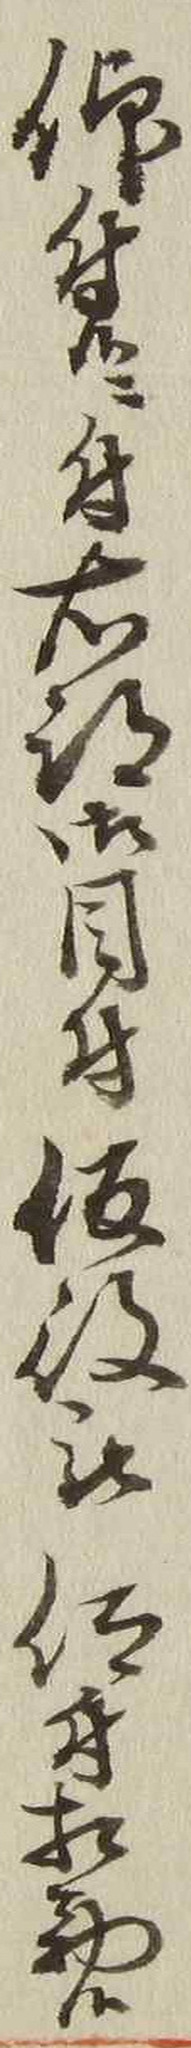仰付候ニ付右跡御目付仮役被仰付相勤候
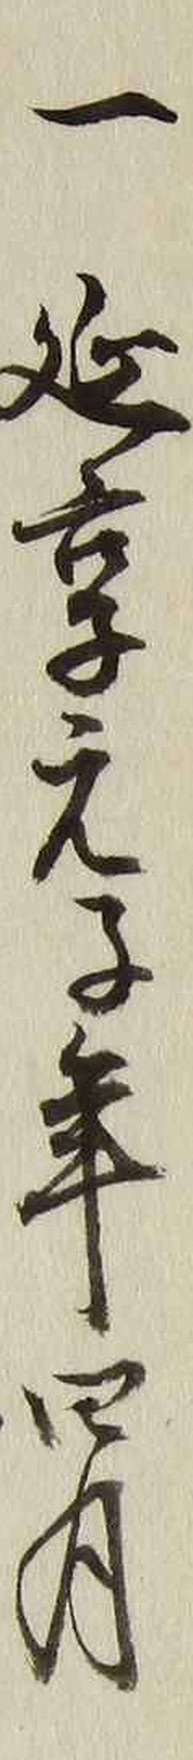一延享元子年四月
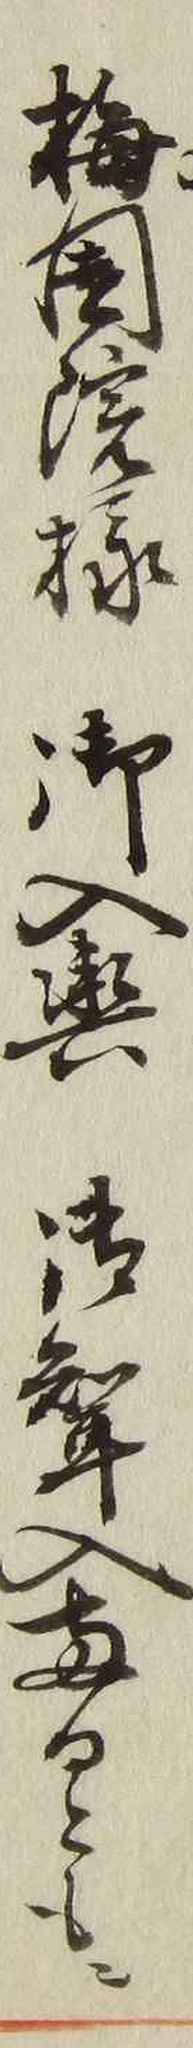梅園院様御入輿御聟入両日ともニ
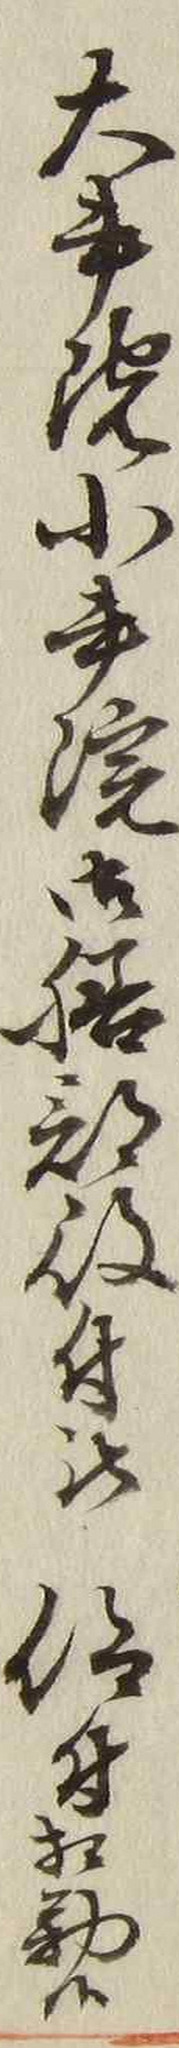大書院小書院御膳部役付被仰付相勤候

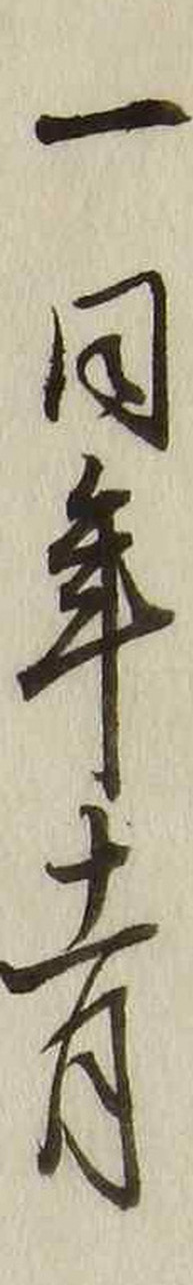一同年十一月
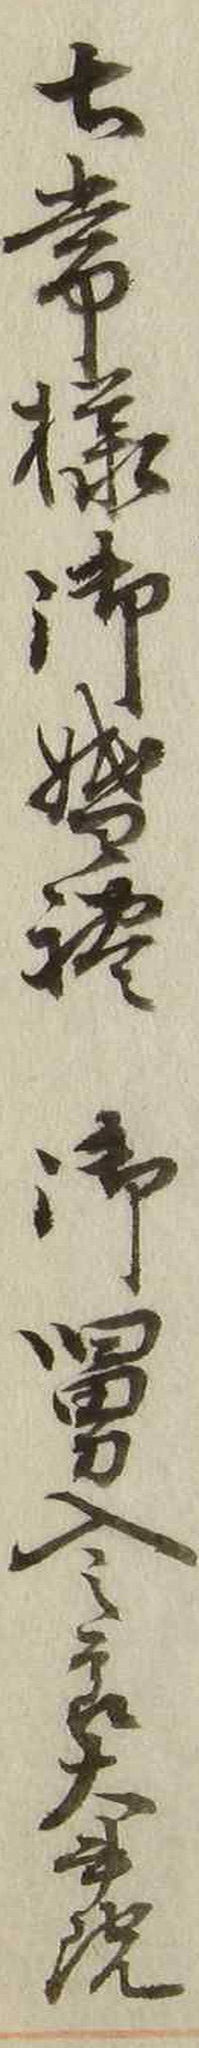土常様御婚礼御舅入之節大書院
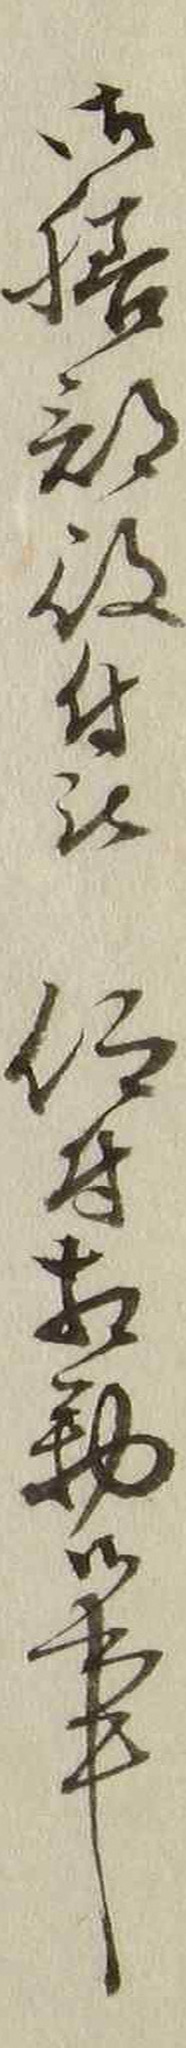御膳部役付被仰付相勤候事
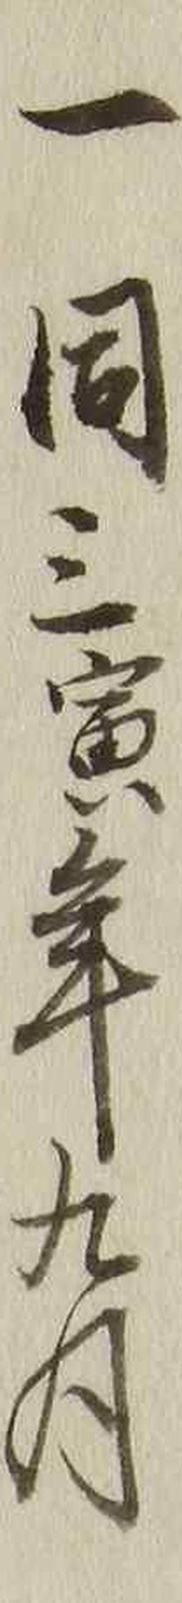一同三寅年九月
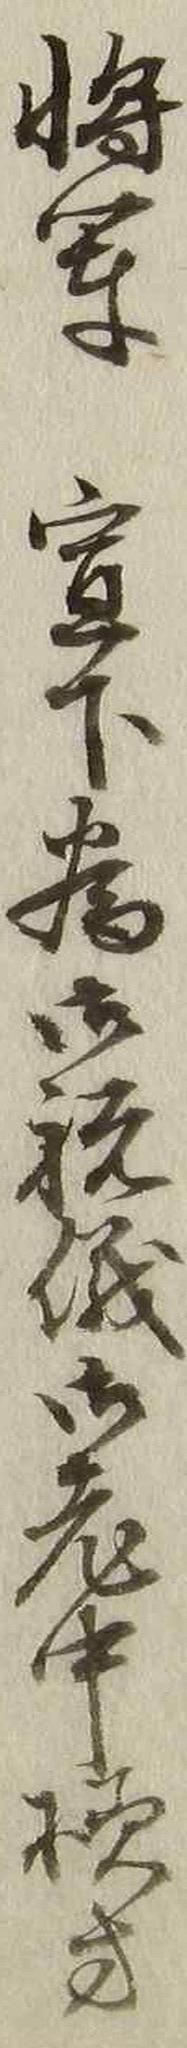将軍宣下為御祝儀御老中様方
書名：諸士系譜　巻之23　い之部23
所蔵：会津若松市立会津図書館
